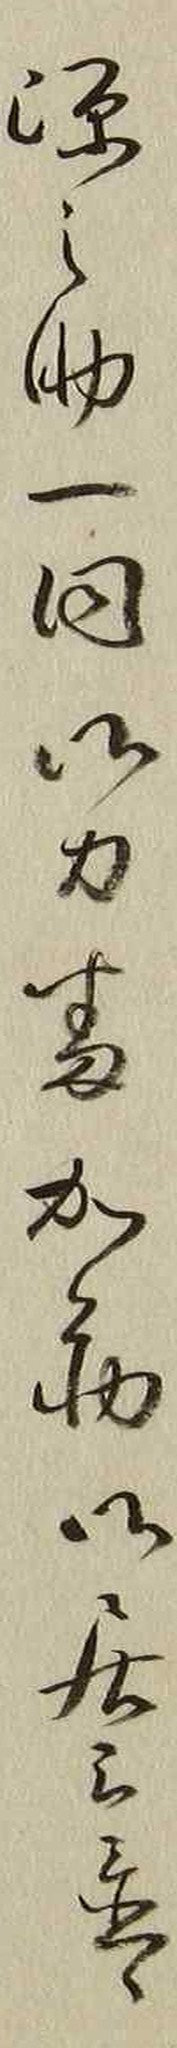源之助一同御刀番加勤御居被置候
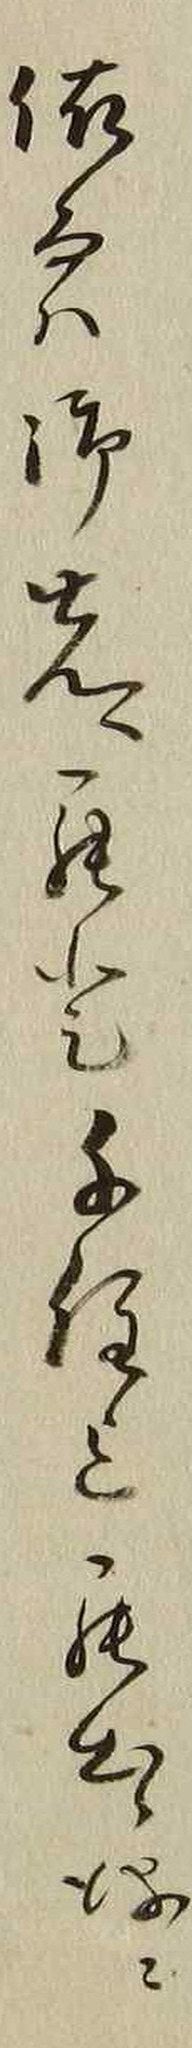依而ハ御先へ罷登千住迄罷出候儀ニ
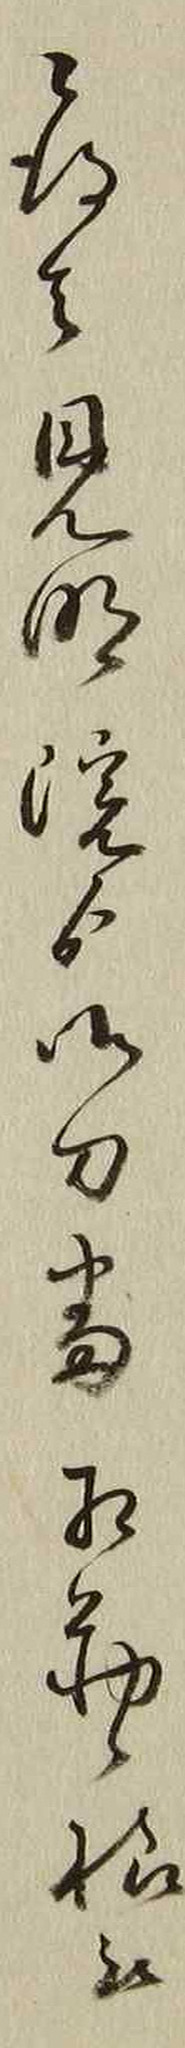候得者見明院ゟ御刀番相勤候様被
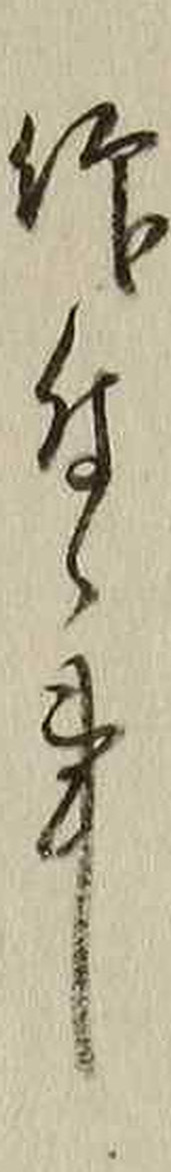仰付候事
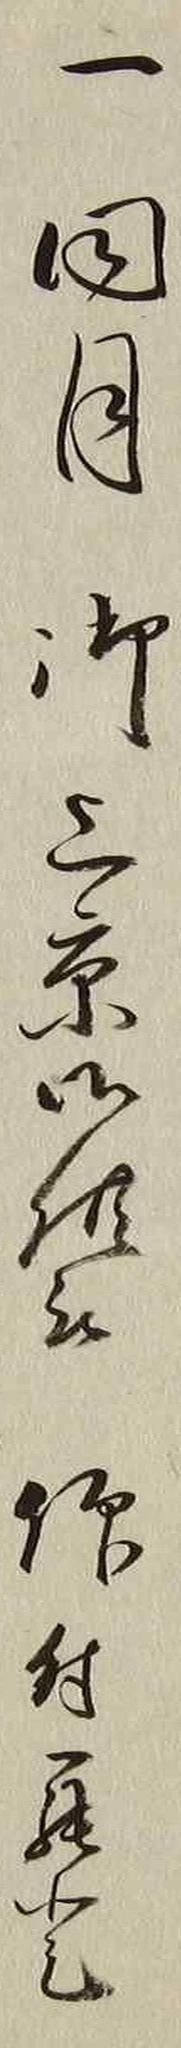一同月御上京御供被仰付罷登
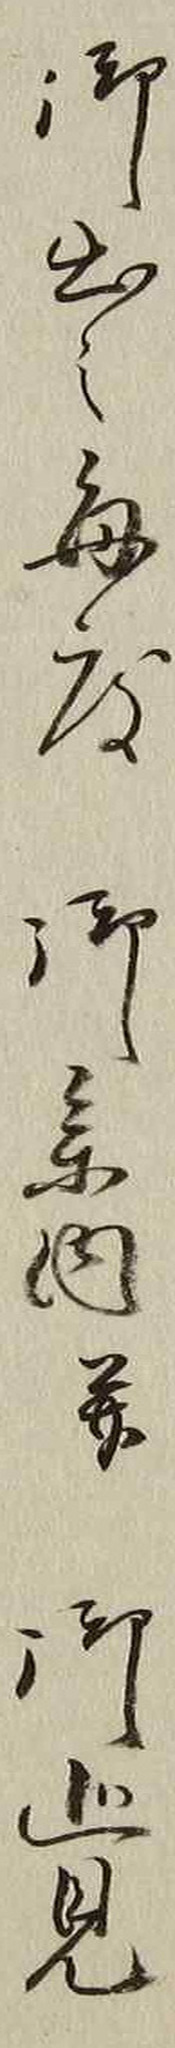御出之毎度御参内并御巡見
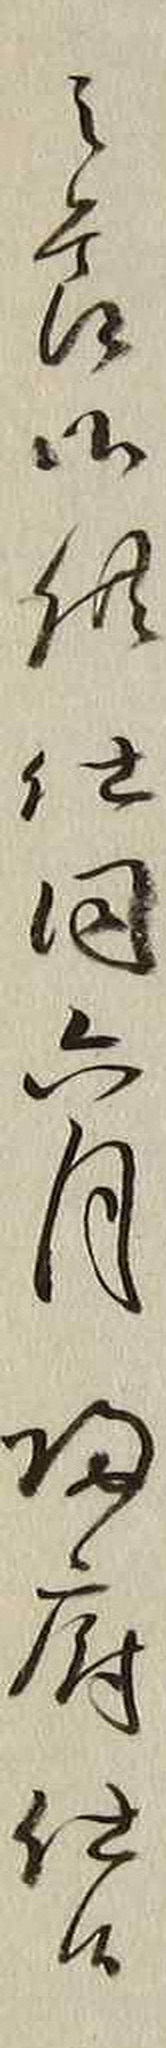之節御供仕同六月帰府仕候
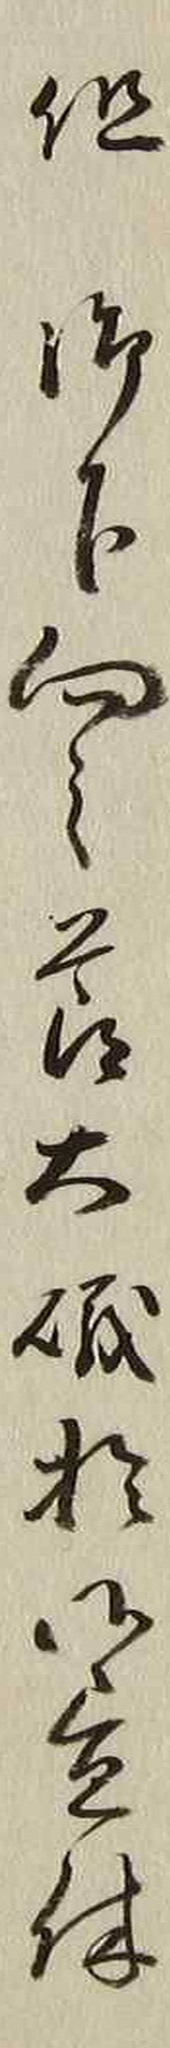但御下向之節大磯於御昼休
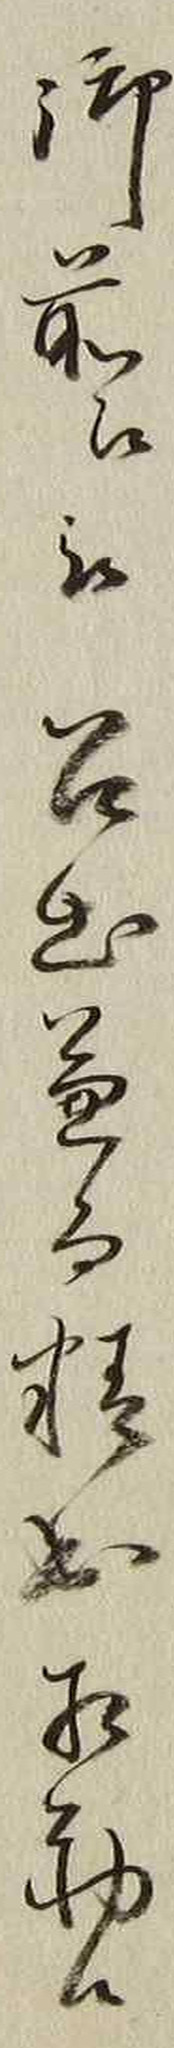御前江被召出兼而精出相勤候
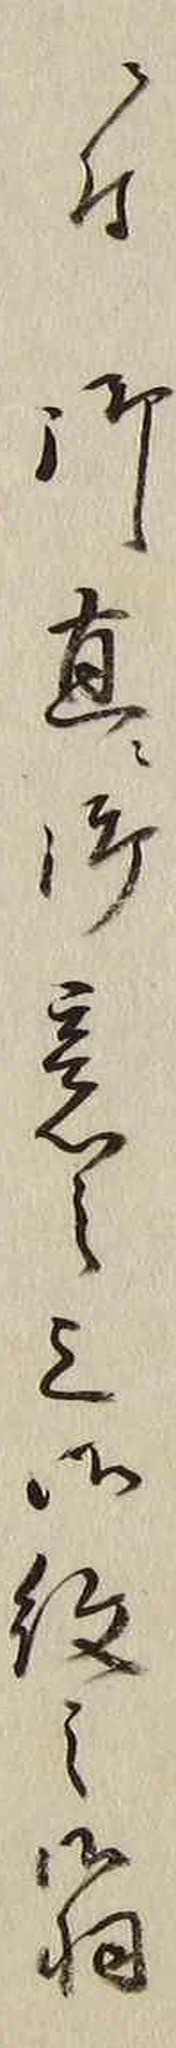ニ付御直ニ御意之上御紋之御羽
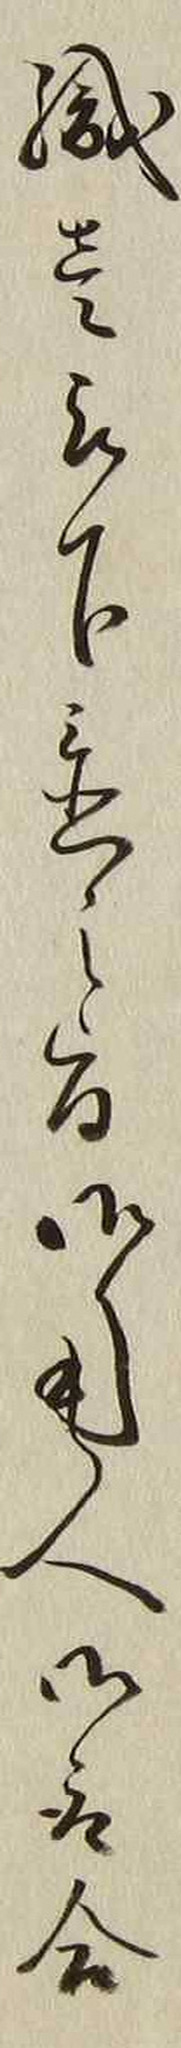織壱被下置之旨御用人御取合
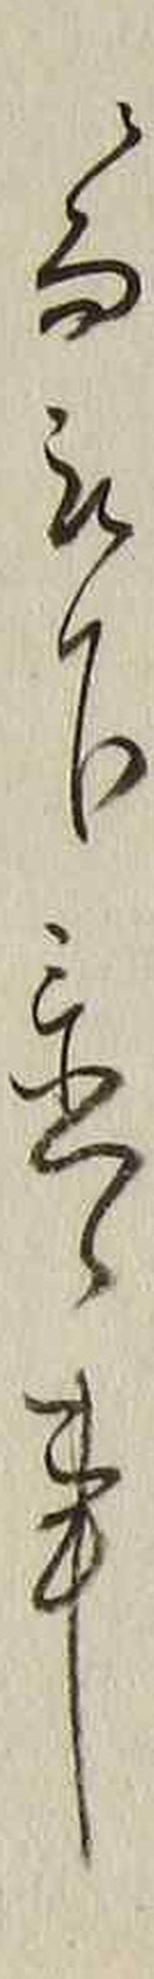ニ而被下置候事
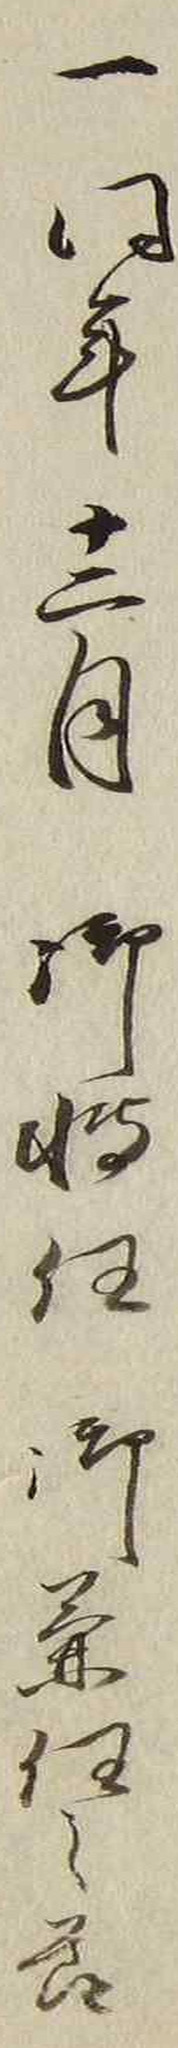一同年十二月御転任御兼任之節
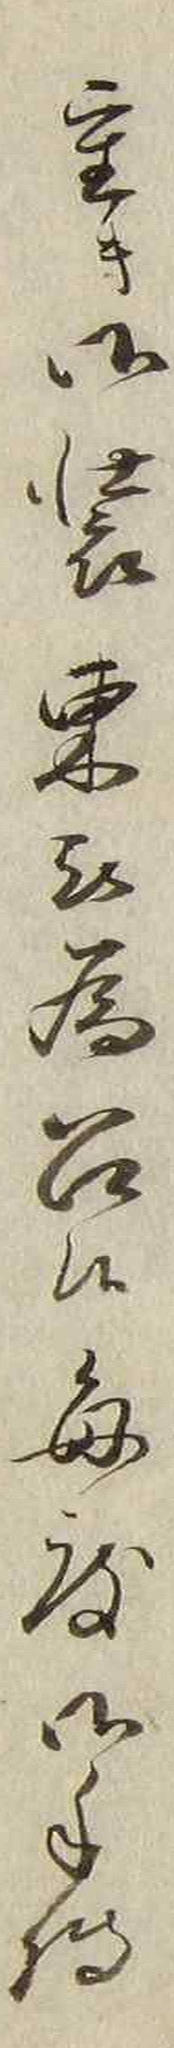重キ御装束被為召候毎度御手伝

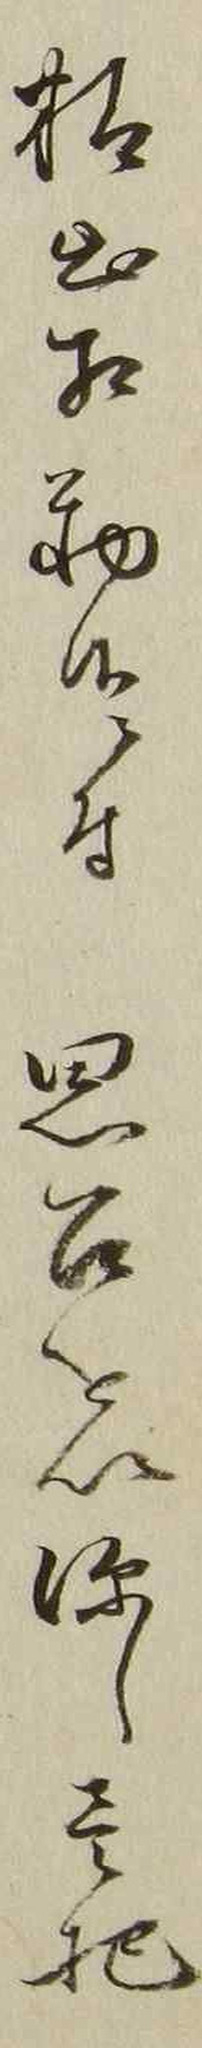精出相勤候ニ付思召を以深し壱把
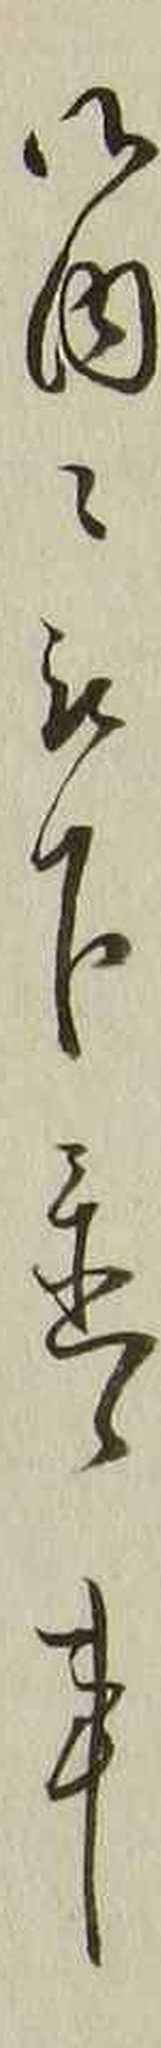御内々被下置候事
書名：諸士系譜　巻之25　い之部25
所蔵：会津若松市立会津図書館
